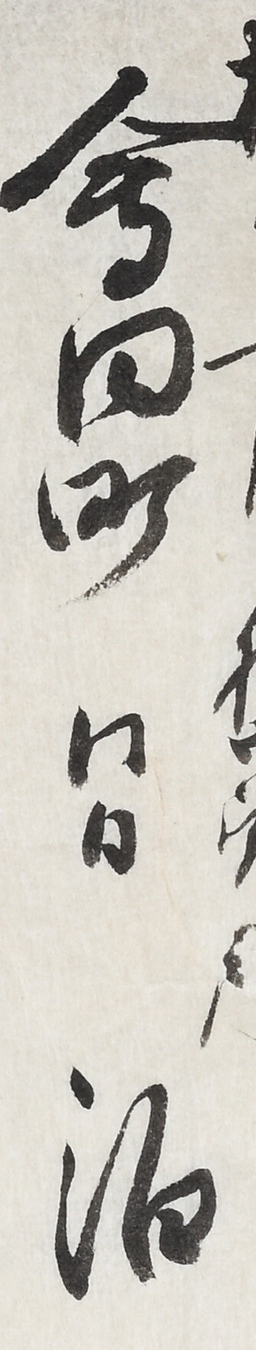会田町同日泊
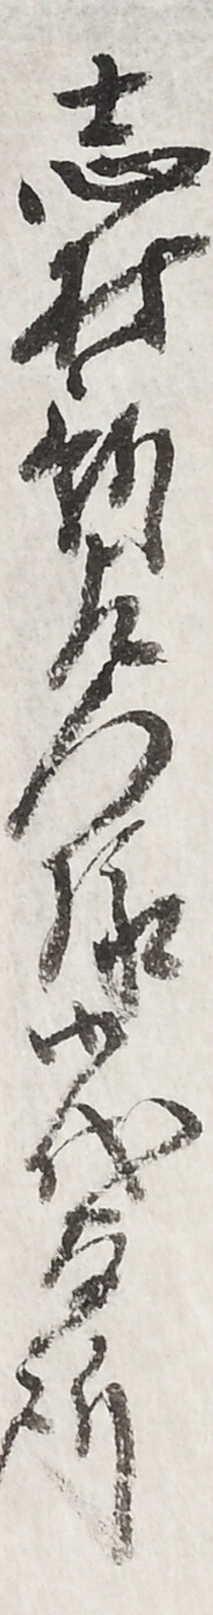志村所左衛門様御代官所
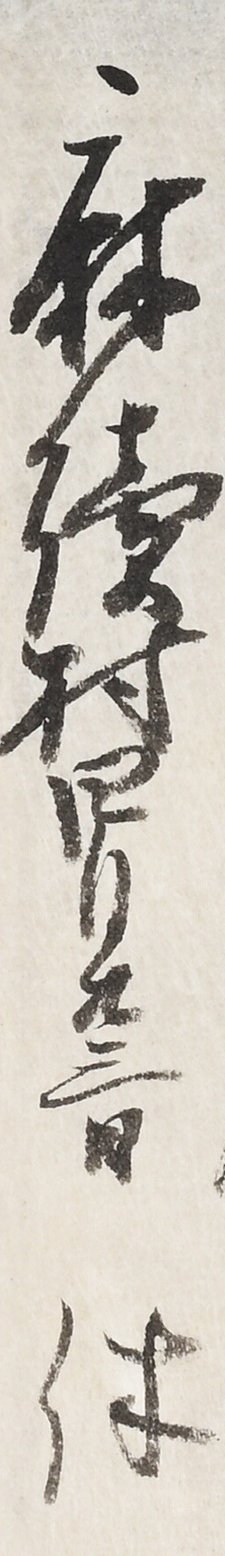麻続村四月廿三日休
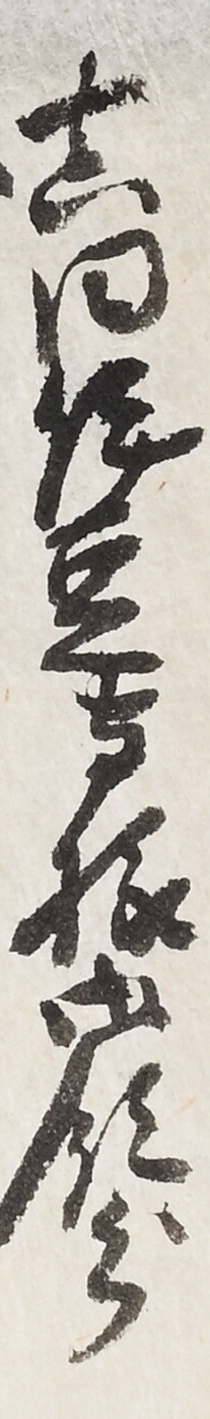真田伊豆守様御領分
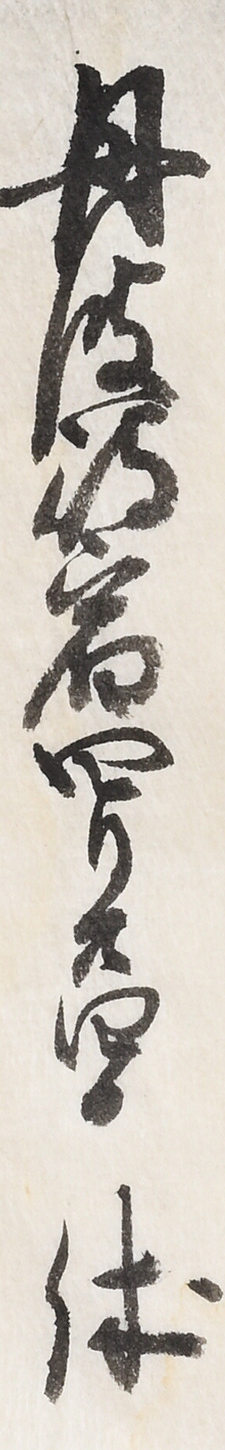丹波島宿四月廿四日休
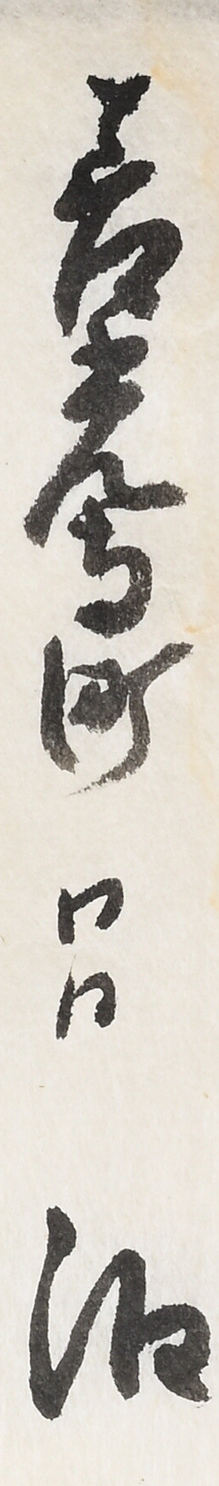善光寺町同日泊
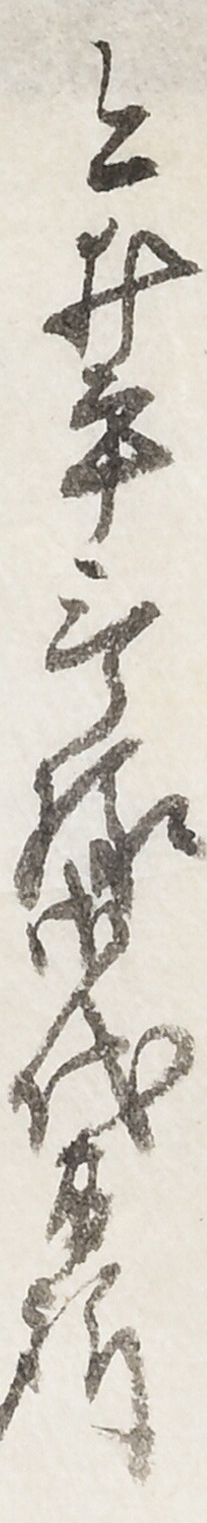今井平三郎様御代官所
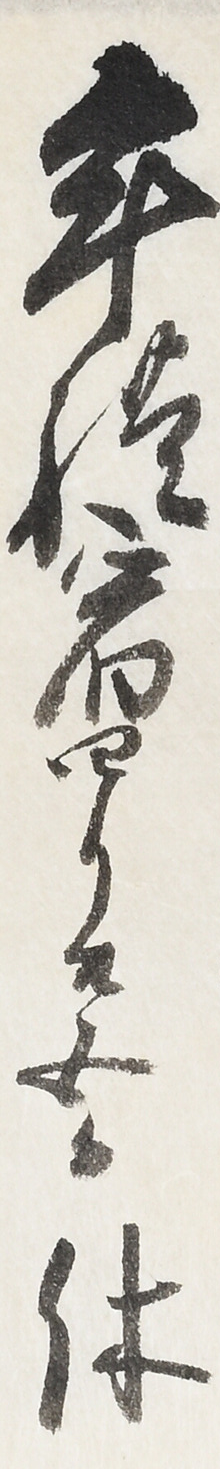牟礼宿四月廿五日休
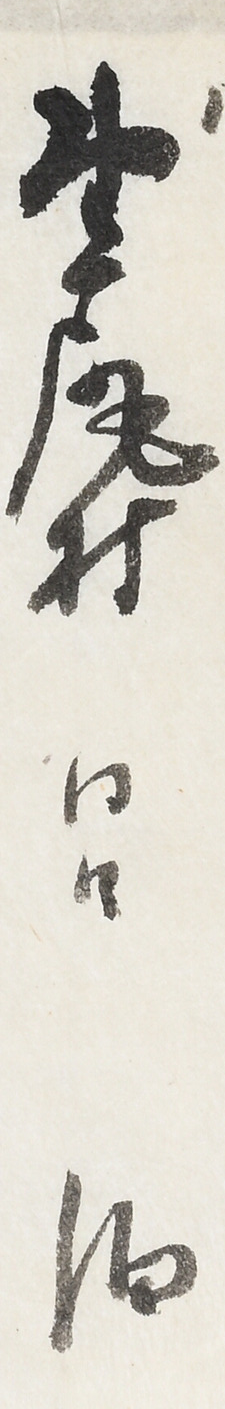野尻村同日泊
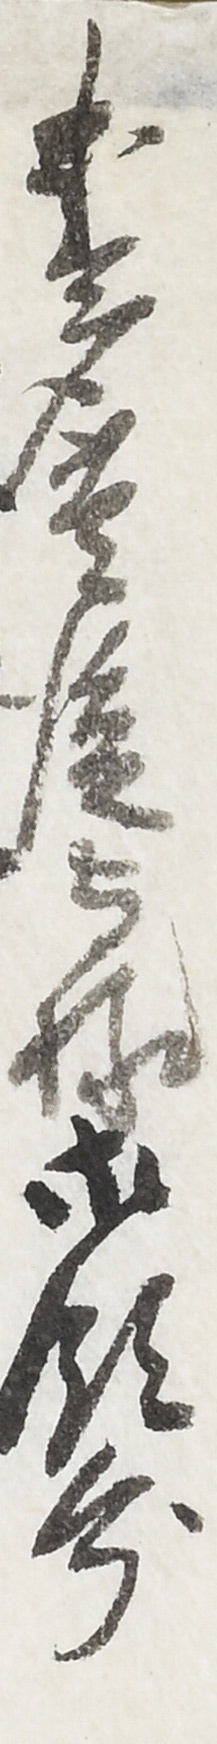本多豊後守様御領分
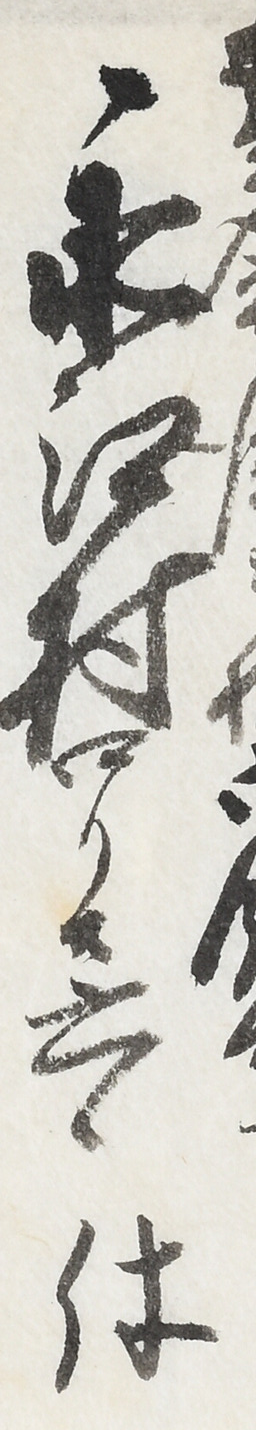永江村四月廿六日休

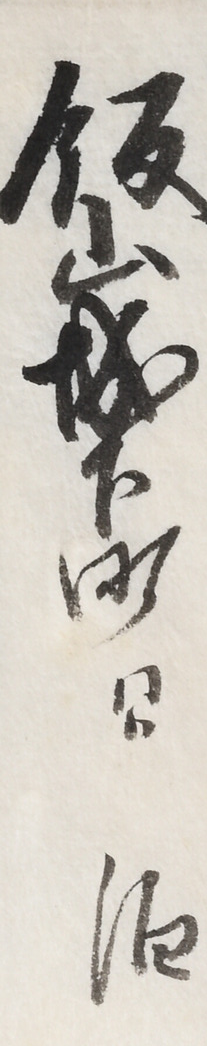飯山城下町同日泊
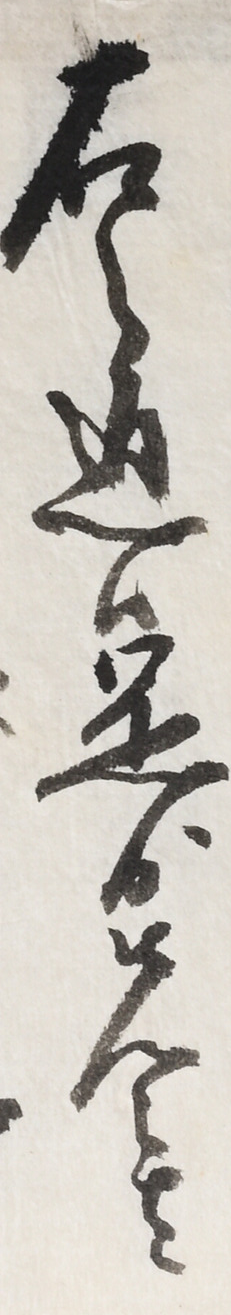右之通候是より先之者
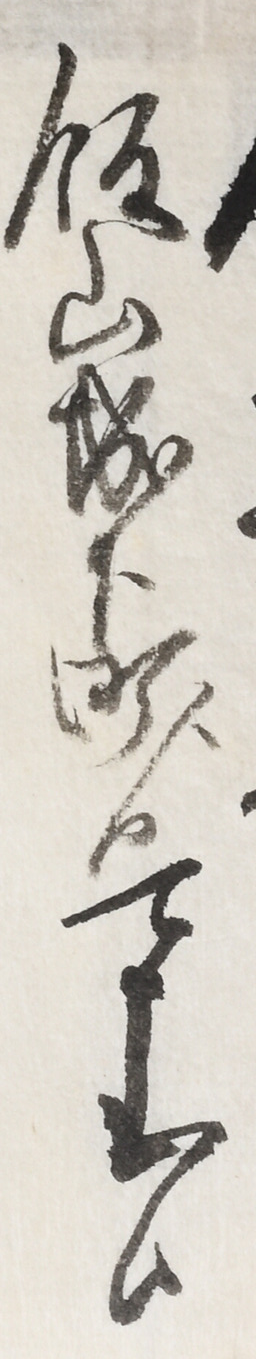飯山城下町より可申出候
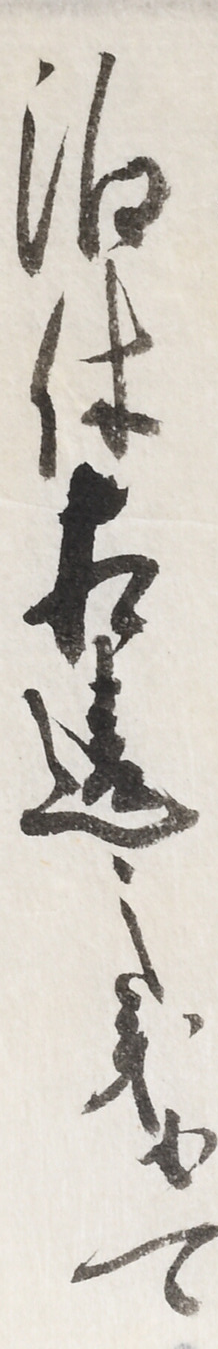泊休相違之義も可
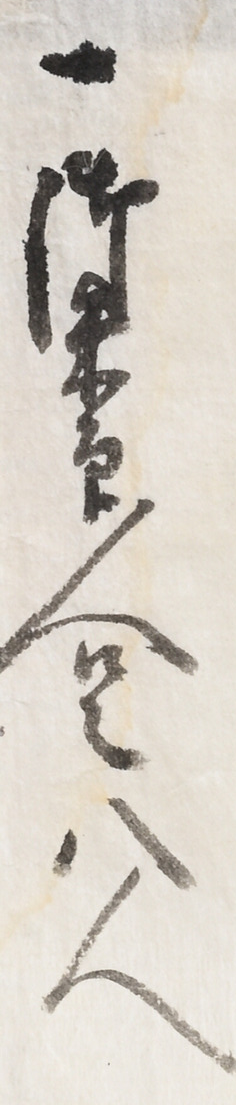一御朱印人足八人
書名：御巡見様御先觸之写
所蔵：伊那市立高遠町図書館・合同会社AMANE
